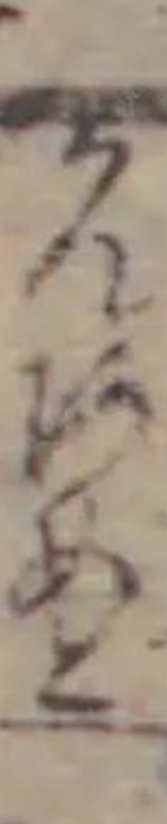かんあめと
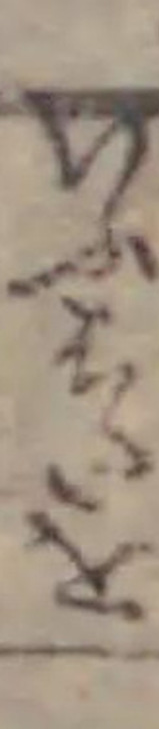いふはたを
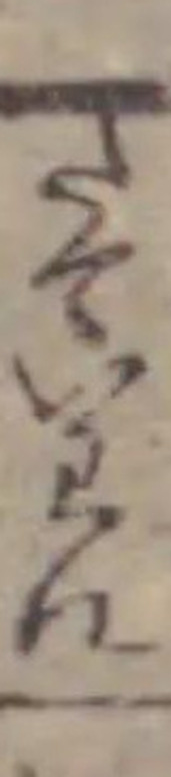たいてわん
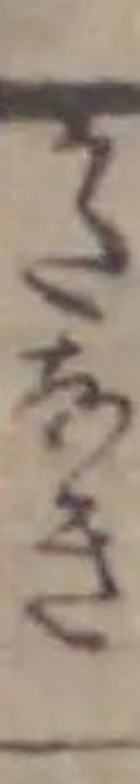かたなき
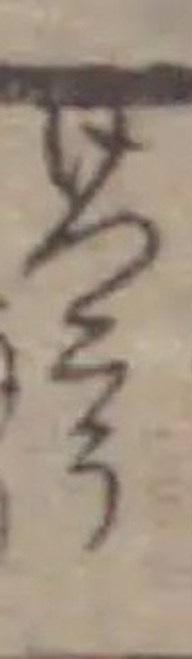けつこう

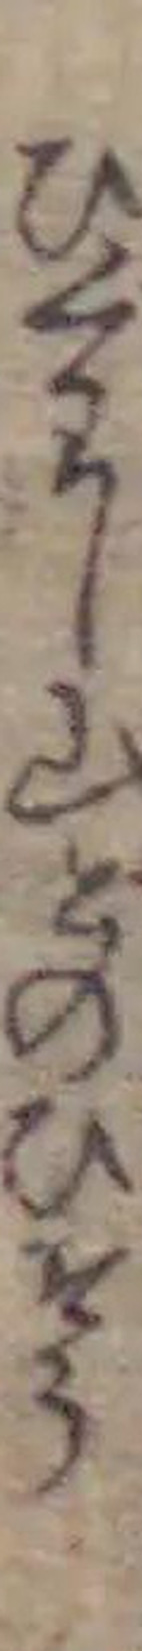ひくわし山どのひそう
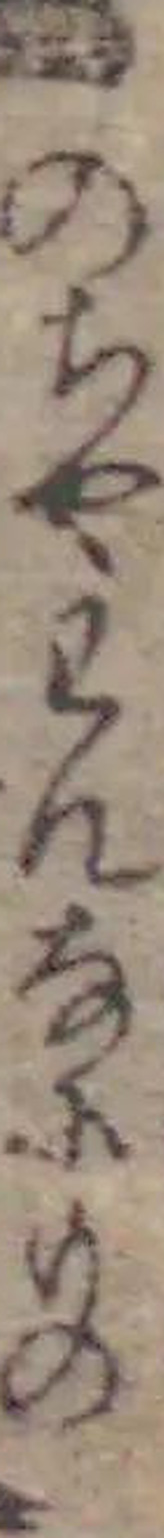のちやわんなにもの
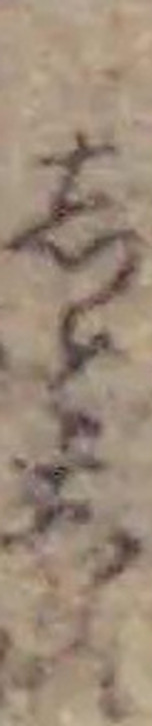しとしれ
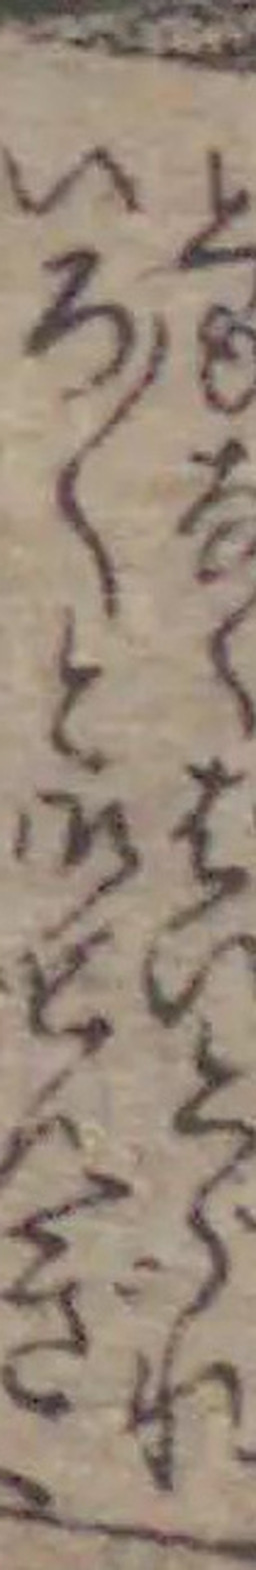いろ〳〵と御せんぎ
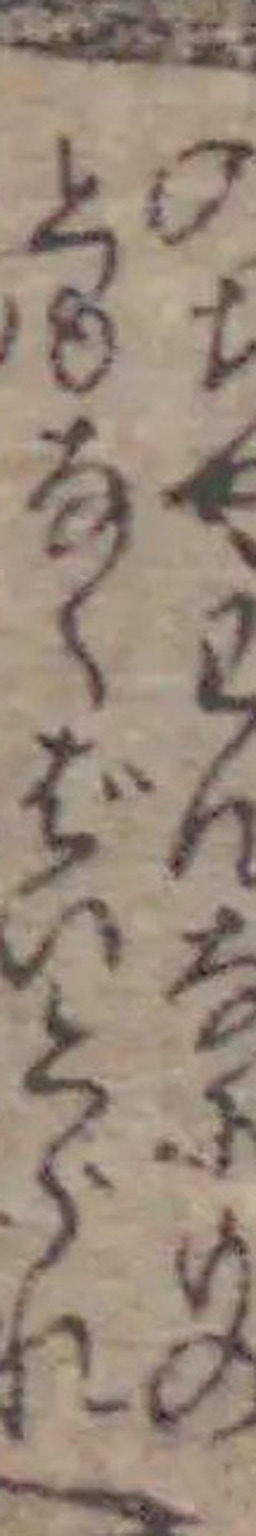ともなくばいとられ
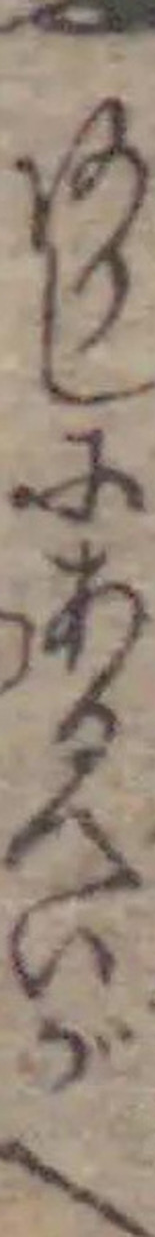ありしにあるへいが
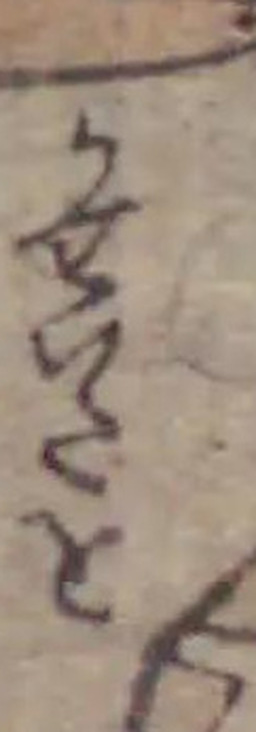かせいたを
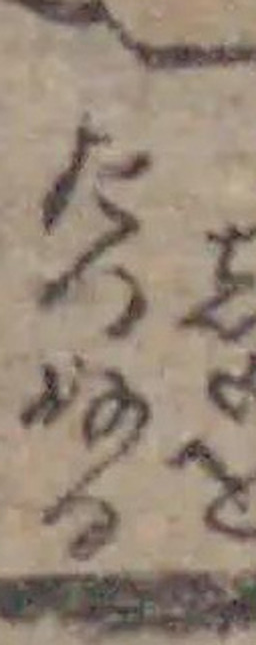たつぬる
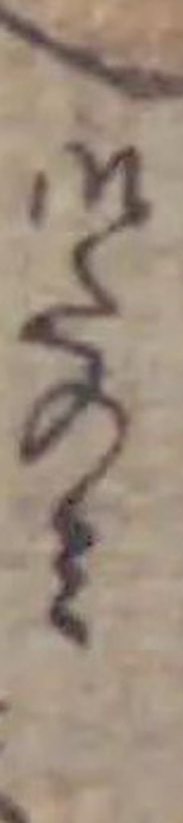御たのみ
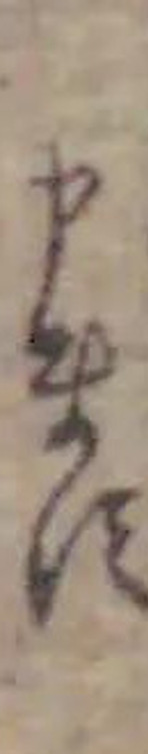申ます
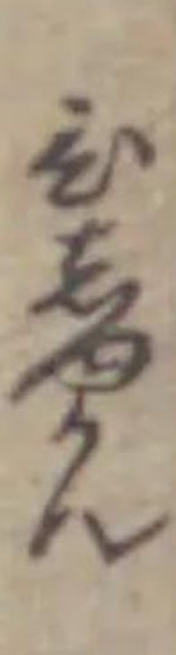ひしやかん
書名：名代干菓子山殿 3巻
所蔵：国立国会図書館 National Diet Library, JAPAN
